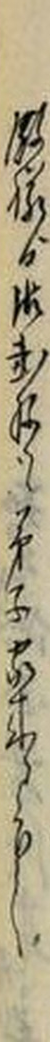殿様ゟ銀弐枚ツヽ弟子家来へ被下之候
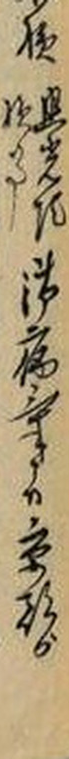様事御病気ニ付京都ゟ
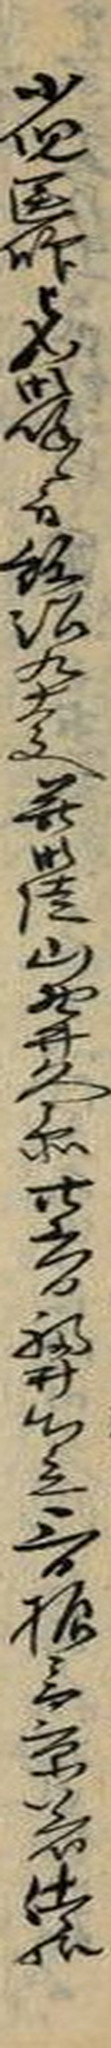小児医師被成御呼候ニ付飯沼九太夫幷御徒山野井久兵衛廿六日福井出立三日振ニ而京着仕候様
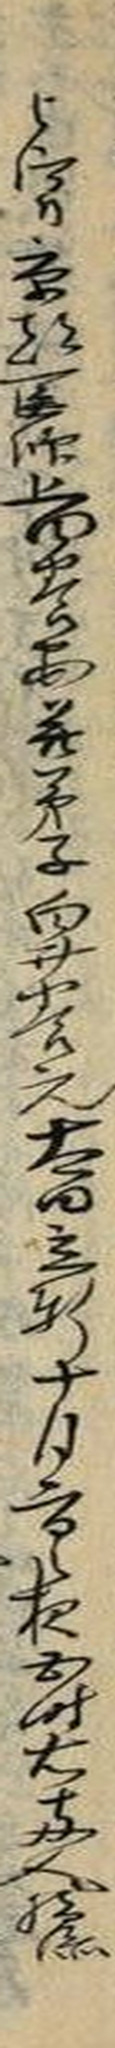被仰付京都医師上田養安幷弟子白井養元太田立軒十月二日之夜五時右両人指添
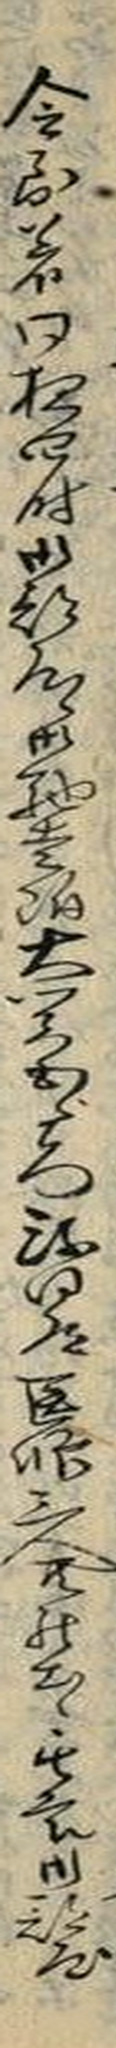令到着同夜四時御部屋へ御馳走附大関五郎右衛門致同道医師三人共罷出候其節御部屋
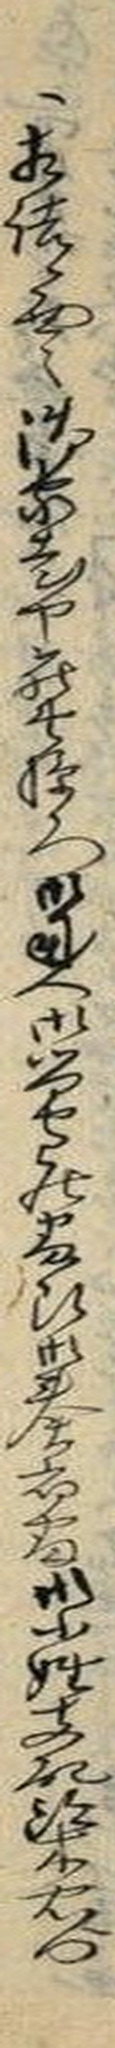へ相詰候面々御家老中荻野孫右衛門御用人御留守居番頭御奏者番御小姓支配鈴木右右衛門
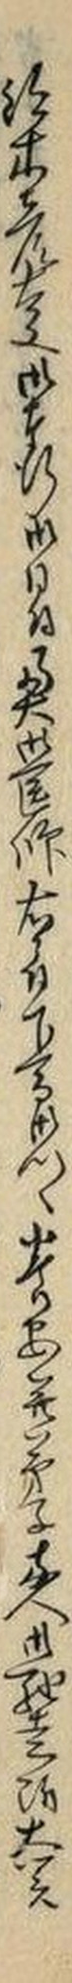鈴木彦太夫御奉行御目付奥御医師右ニ付下馬御門へ養安幷弟子両人御馳走附大関
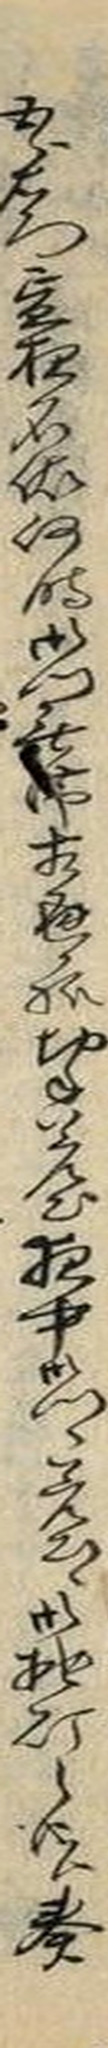五郎右衛門昼夜不依何時御門無滞相通候様切手差出夜中御門へ差出候御提灯之儀ハ奏
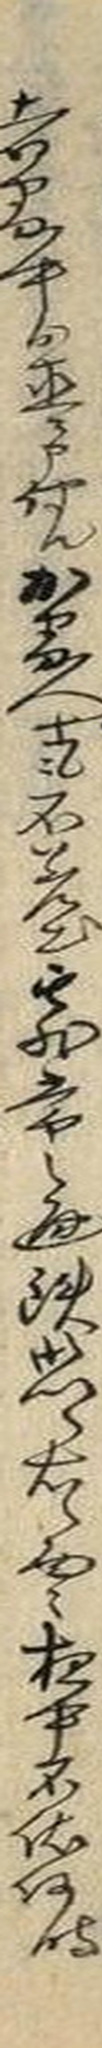者番中ゟ直ニ申付ル加番人等も不差出其外常之通鉄御門へ右之面々夜中不依何時
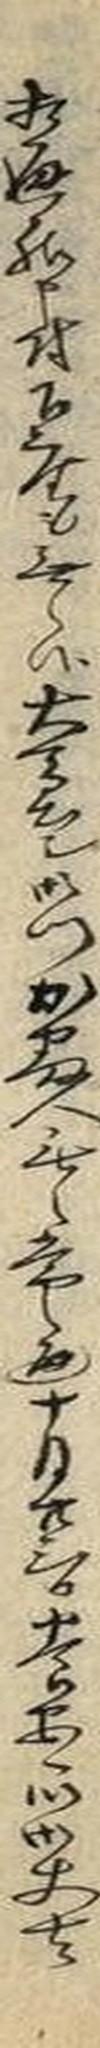相通候様申付下座も無之候大馬出シ御門加番人無之常之通十月廿三日養安へ御使者
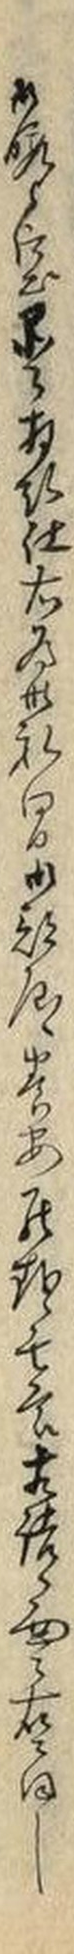御暇被仰出品々拝領仕右為御礼同日御部屋へ養安罷越候其節相詰候面々右ニ同し
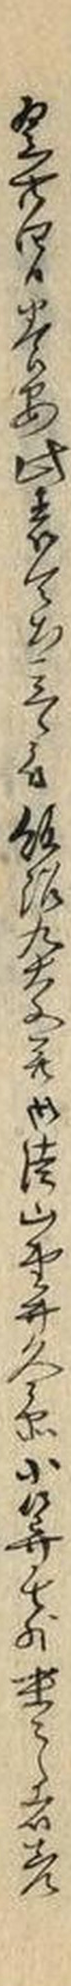翌廿四日養安此表令出立候ニ付飯沼九太夫幷御徒山野井久兵衛小算其外末々之者差
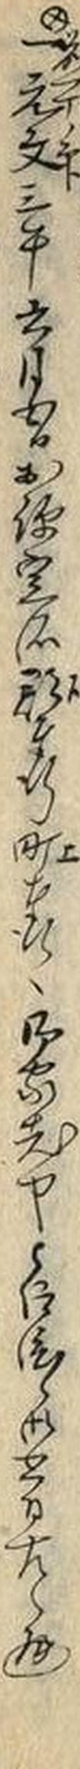一元文三午六月五日於評定所郡奉行町奉行へ御家老中被仰渡候御書付左之通
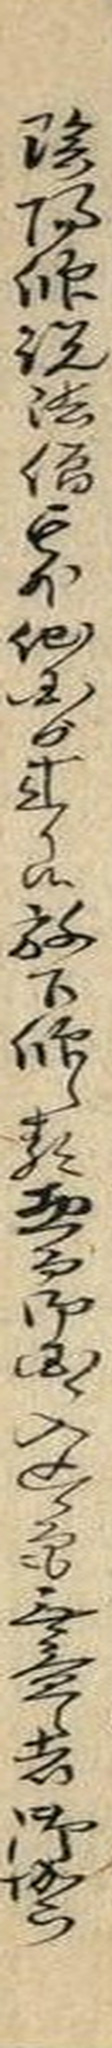陰陽師説法僧其外他国ゟ来り候放下師之類惣而御国へ入込候而も無益之者御城下
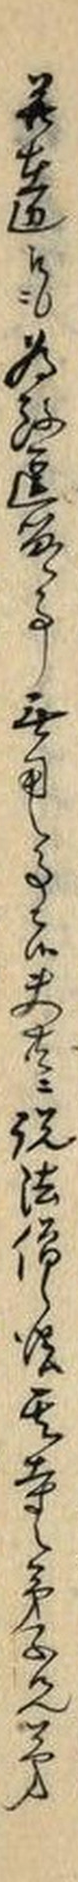幷在辺江も為致逗留候事無用之事ニ候夫共ニ説法僧之儀ハ其寺之弟子兄弟
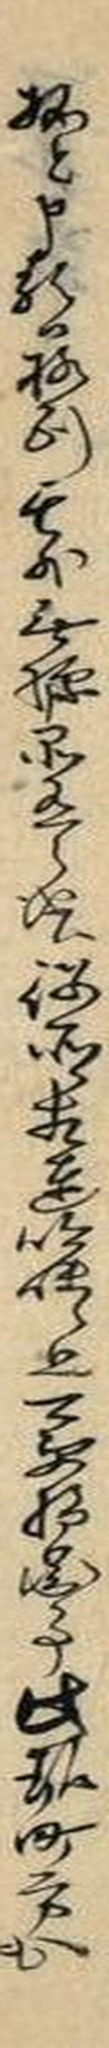抔と申類ハ格別其外無拠品有之儀ハ役所へ相達吟味之上可受指図事此趣町方へも
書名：御国他国諸事之部
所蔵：福井県文書館 Fukui Prefectural Archives
